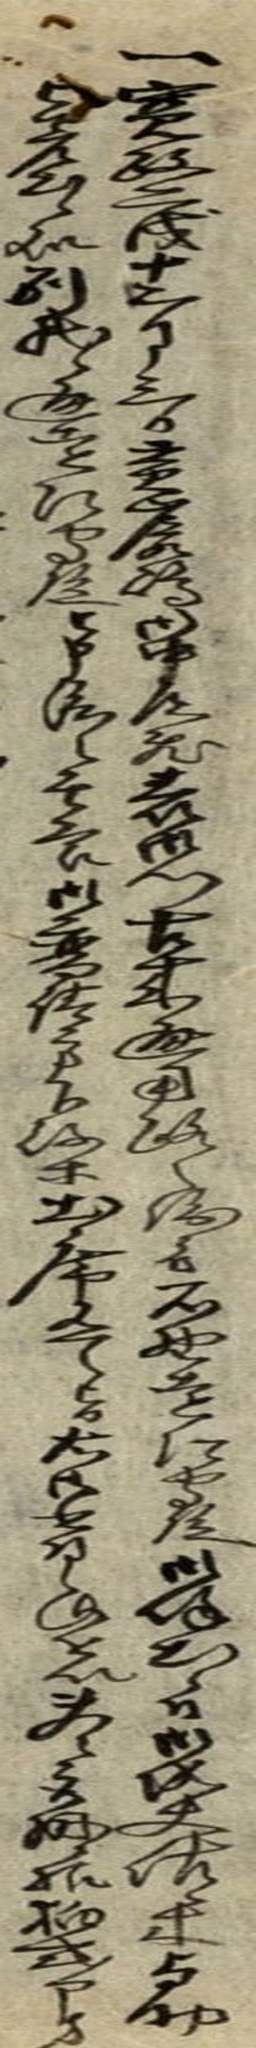迄差出候処別紙之通遠江守殿被申渡候其節御普請方下役等出席有之旨右御書付之趣を以夫々取扱候様狛式部方
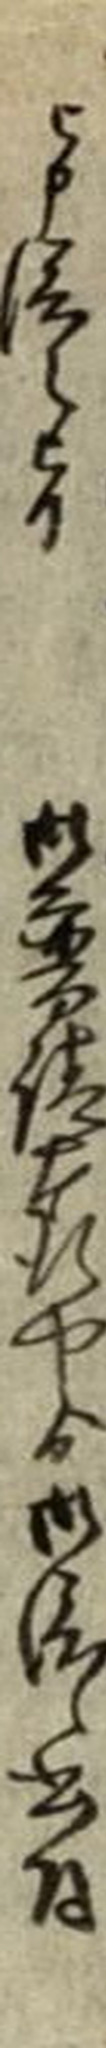被申渡候旨御普請奉行中ゟ御渡候書付
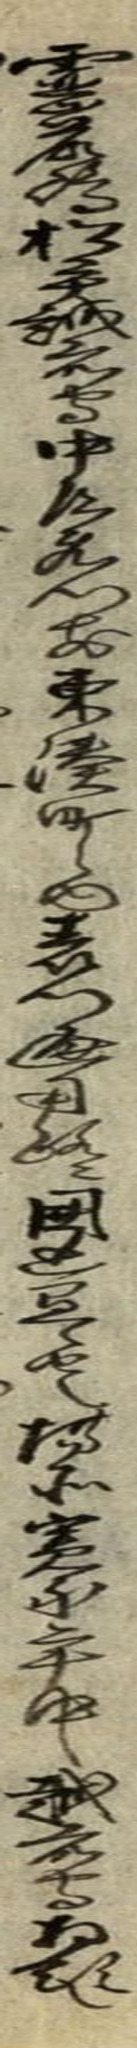霊巌嶋松平越前守中屋敷門前東湊町之内表門通用路に囲込置候由之場所寛永年中越前守拝領之
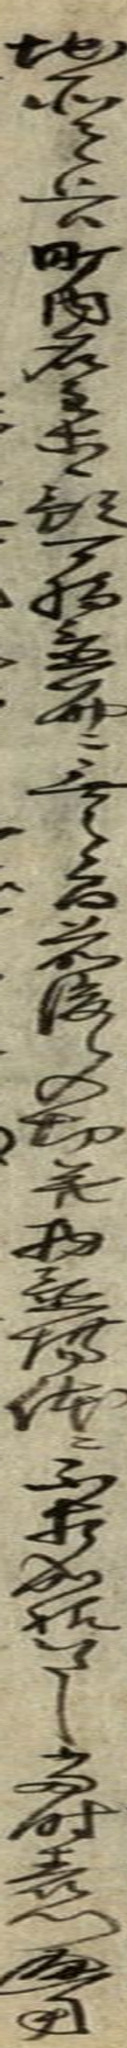地所に候上は町内名主等に預可指置筋に無之候間前後へ〆切幷物置場体に不相成様いたし当時表門通用
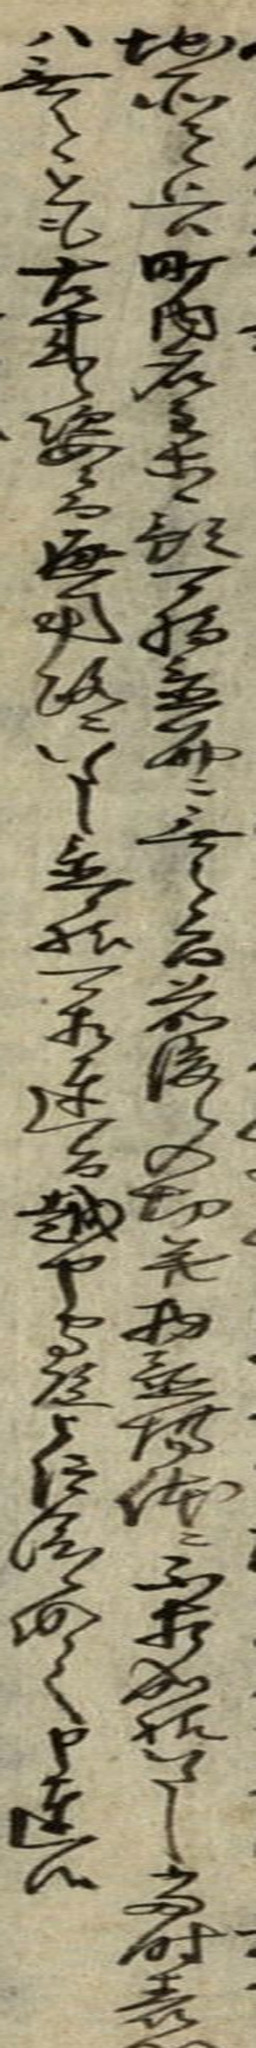は無之候とも古来之姿にて通用路にいたし置候様可相達旨越中守殿被仰渡候仍之申達候
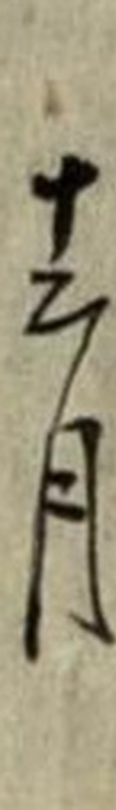十二月
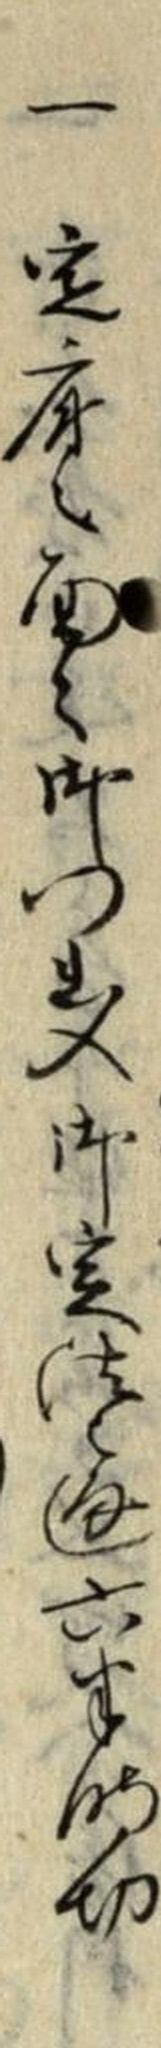一定府之面々御門出入御定法之通六半時切
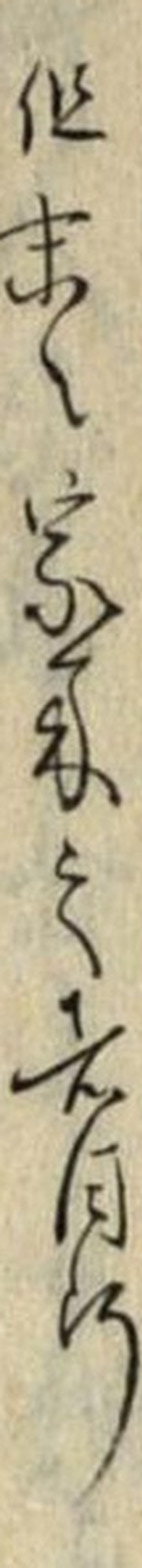但末々家来之者同断
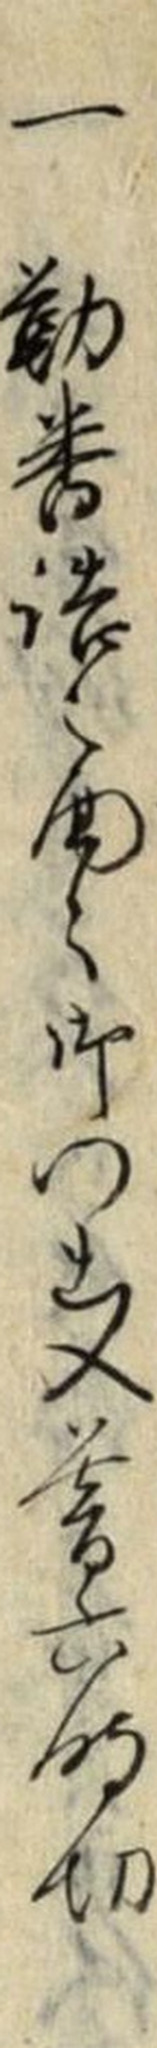一勤番詰之面々御門出入暮六時切
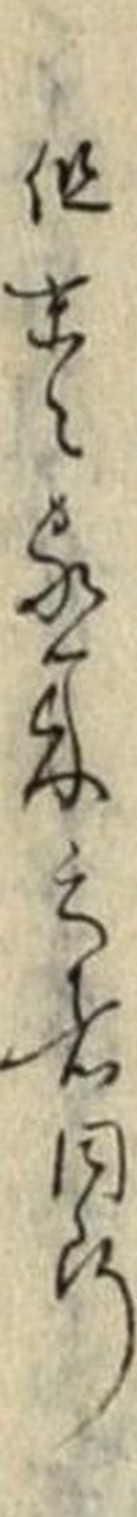但末々家来之者同断
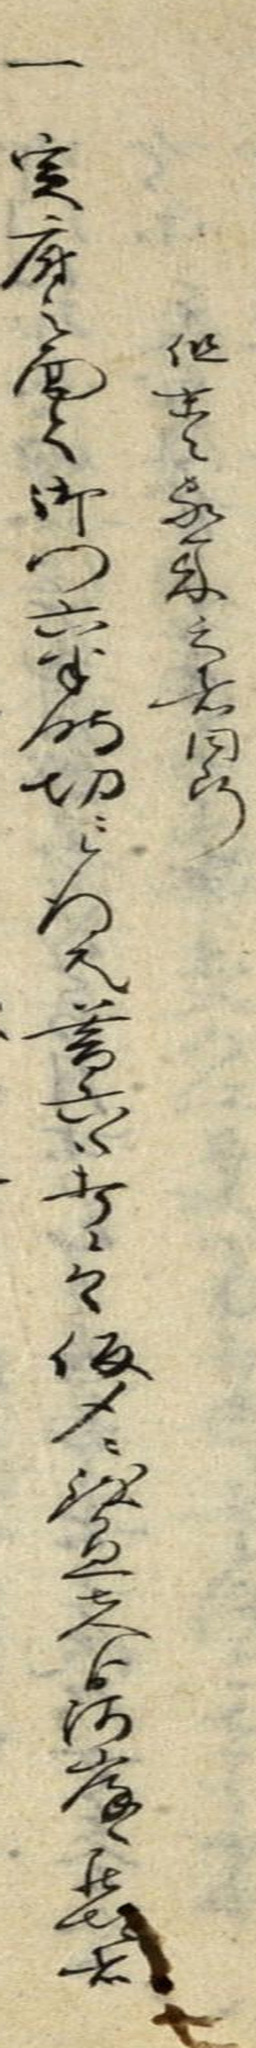一定府之面々御門六半時切に候得共暮六ツ打候はゝ仮〆に致置夫ゟ河岸へ罷出候者
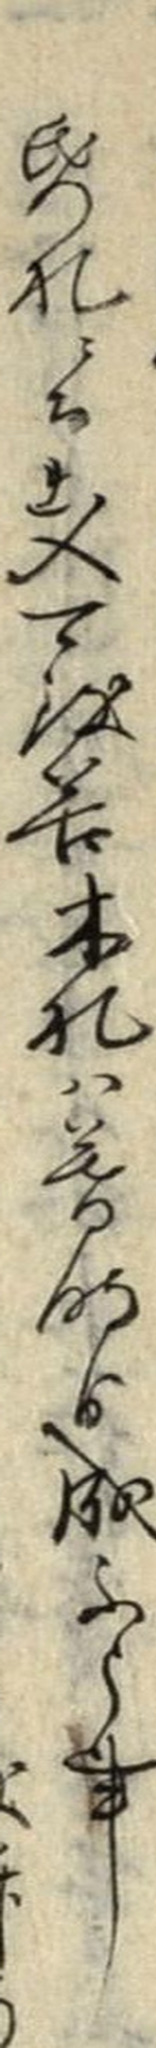紙札にて出入可致筈木札は暮時ゟ成不申事
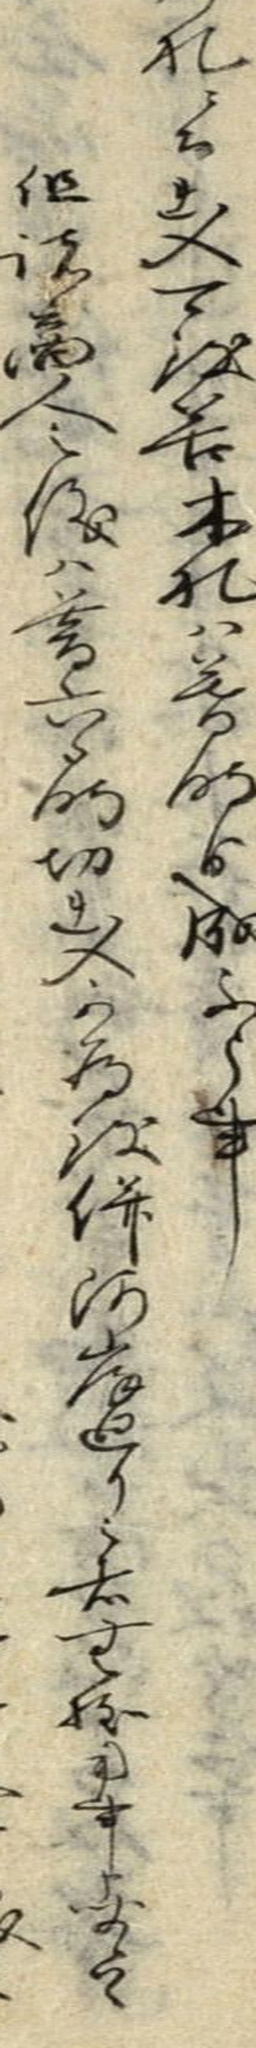但諸商人之儀は暮六ツ時切出入可為致併河岸廻り之者無據用事申聞候はゝ
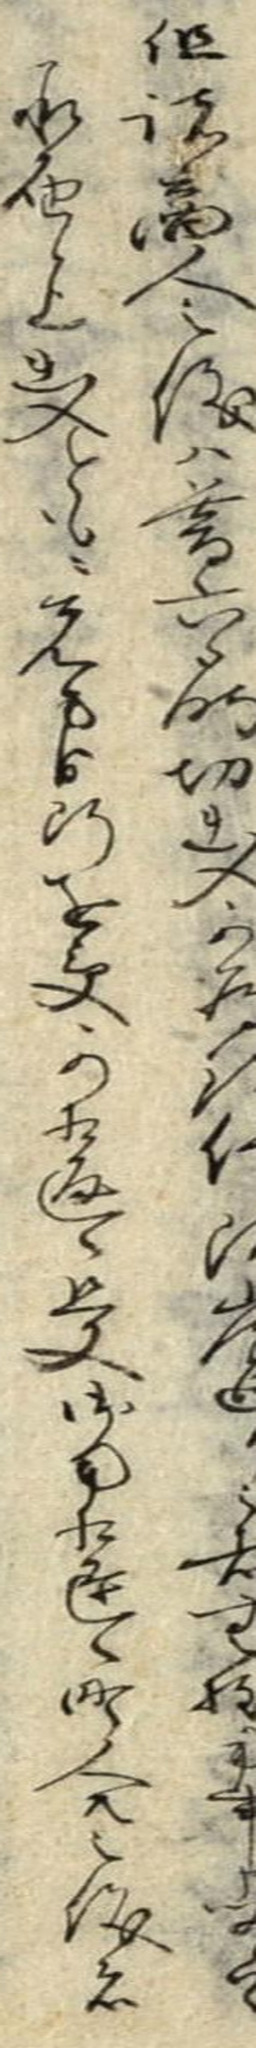承届之上出入ともに先方ゟ断を受可相通候且又御用相達候町人共之儀は
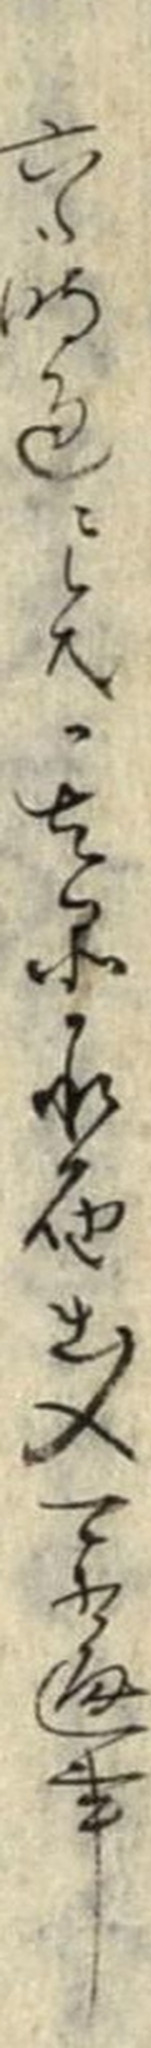六ツ時過に候共其品承届出入可相通事
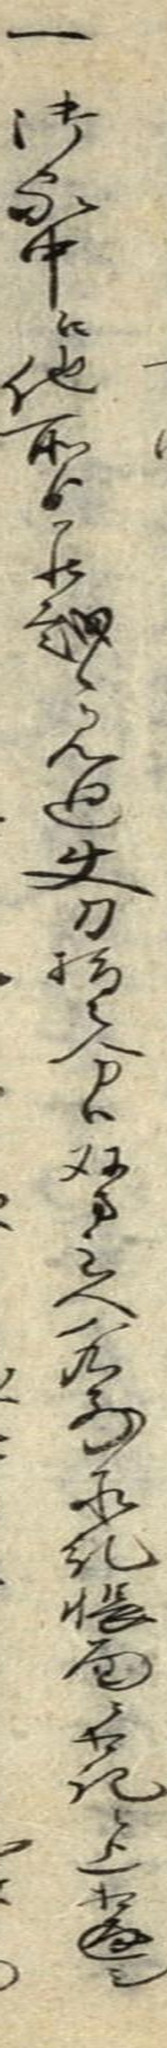一御家中江他所ゟ罷越候見廻使刀指候分は双方主人名前承糺帳面に相記候上相通し
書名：三都并道中之部
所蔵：福井県文書館 Fukui Prefectural Archives
